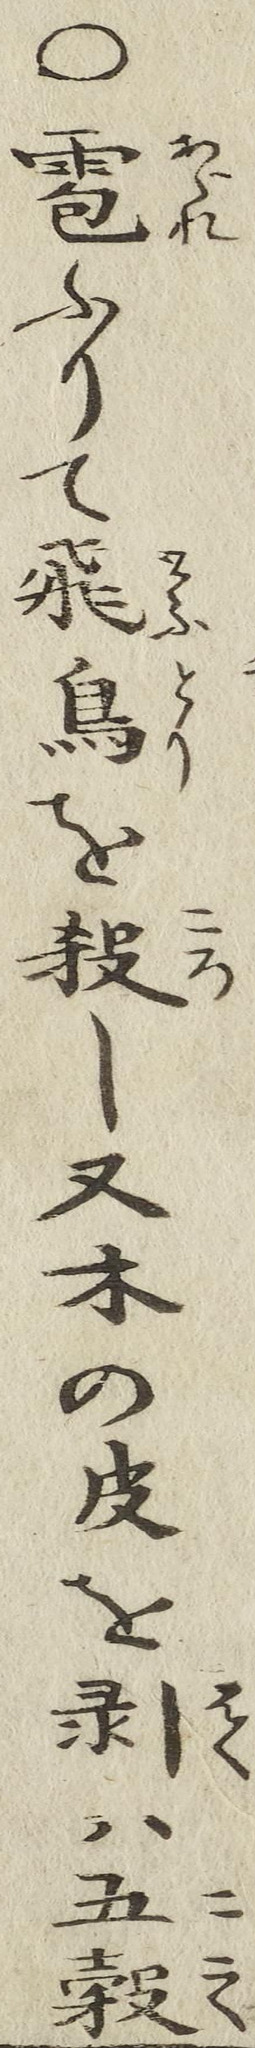〇雹ふりて飛鳥を殺し又木の皮を剥は五穀
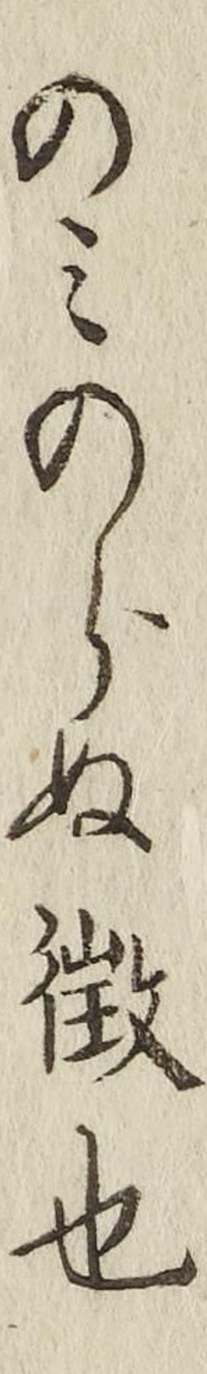のみのらぬ徴也
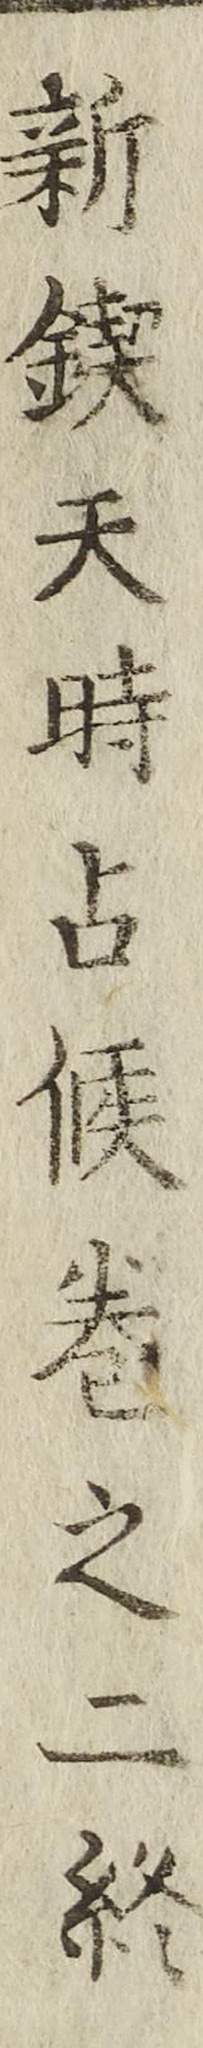新鍥天時占候巻之二終
